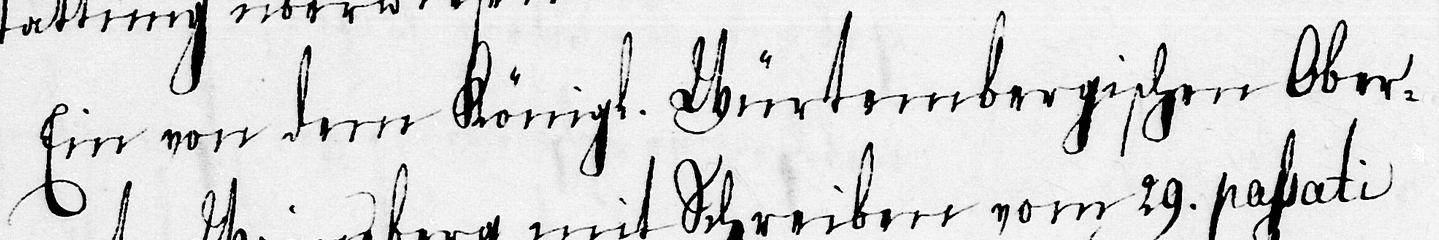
Ein von dem Königl. Würtembergischen Ober¬
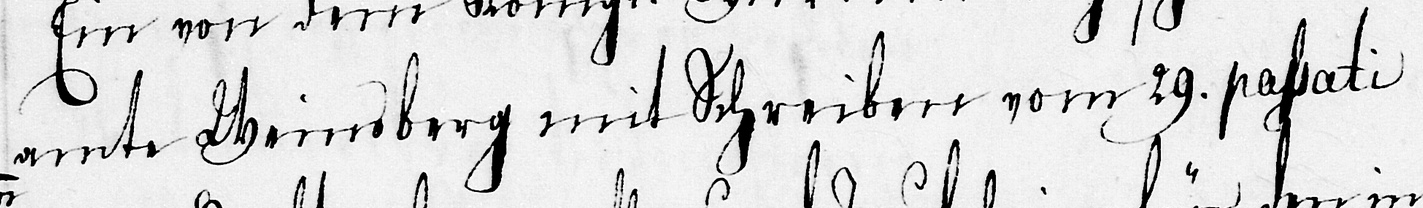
amte Weinsberg mit Schreiben vom 29. passati
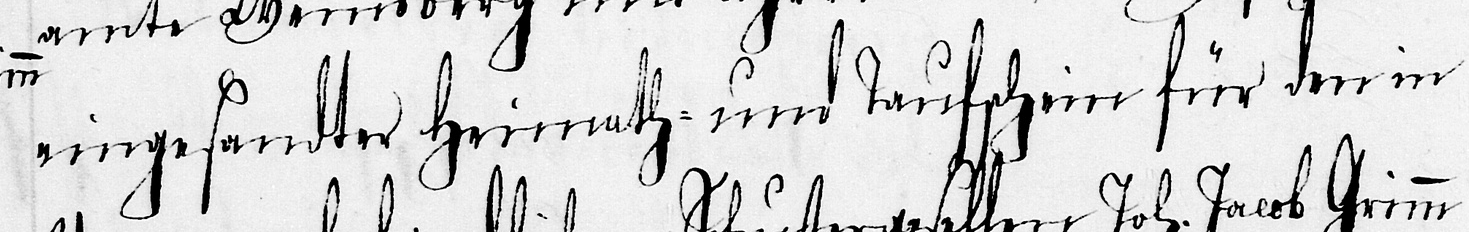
eingesandter Heimath- und Taufschein für den in
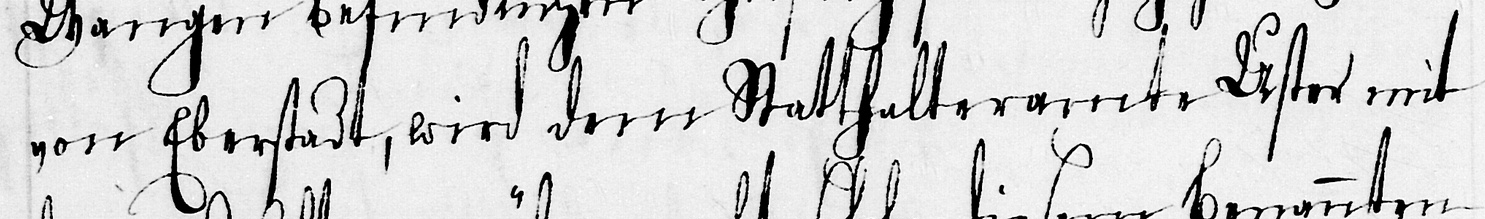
von Eberstadt, wird dem Statthalteramte Uster mit
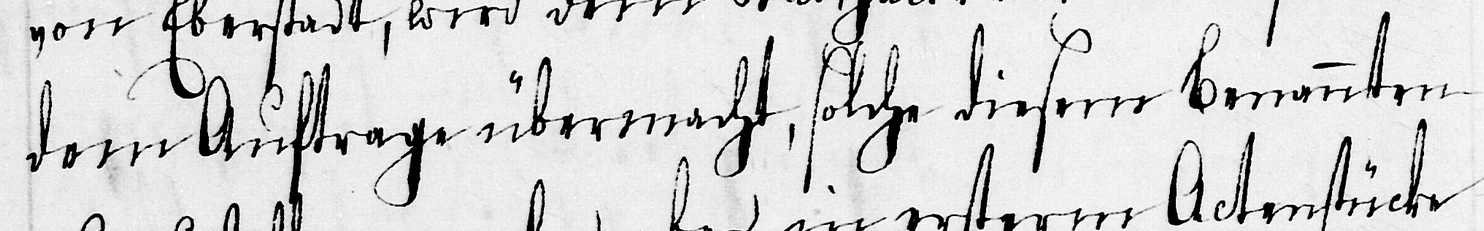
dem Auftrage übermacht, solche diesem Benannten
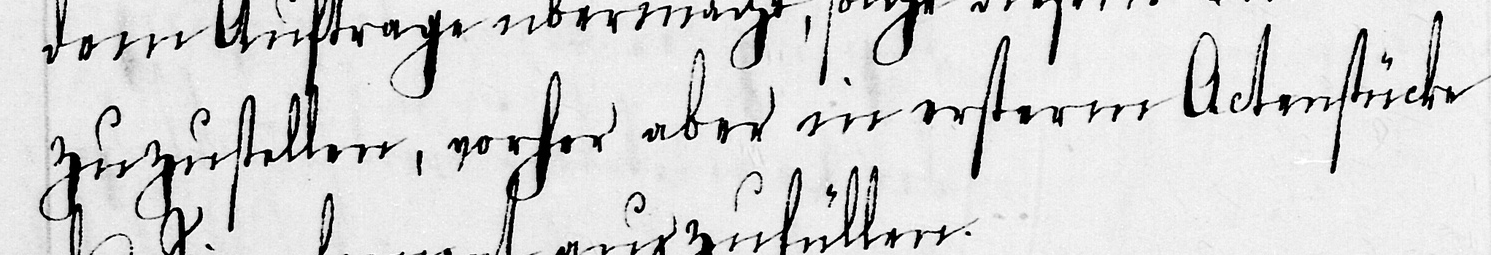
zuzustellen, vorher aber in ersterm Actenstücke
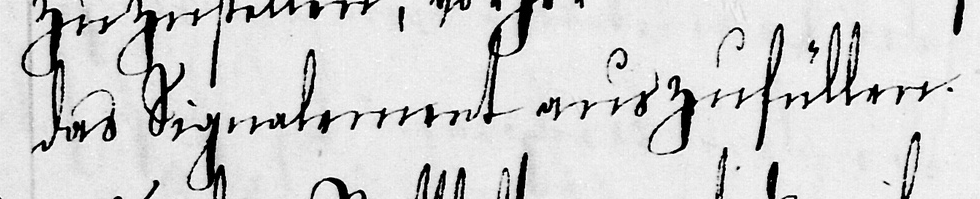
das Signalement auszufüllen.
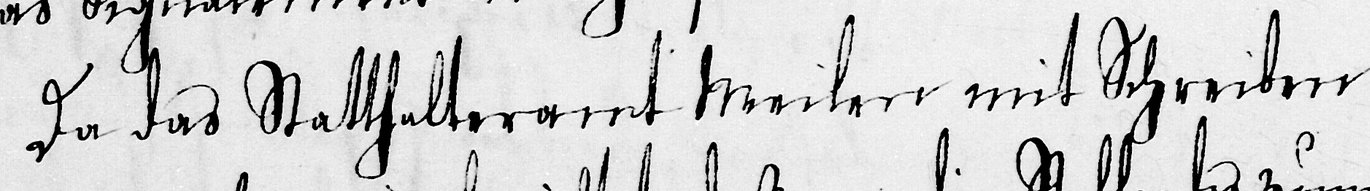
Da das Statthalteramt Meilen mit Schreiben
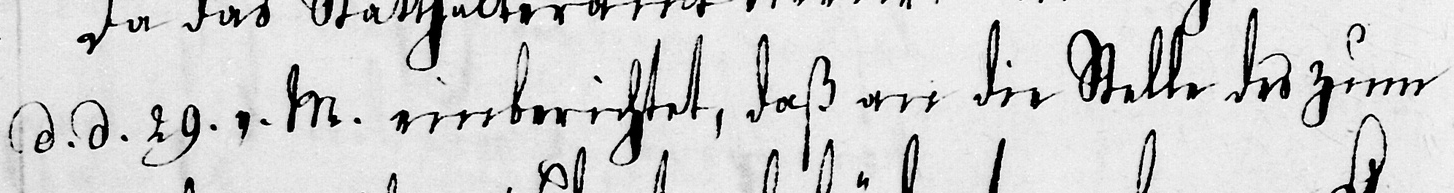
d. d. 29. v. M. einberichtet, daß an die Stelle des zum
